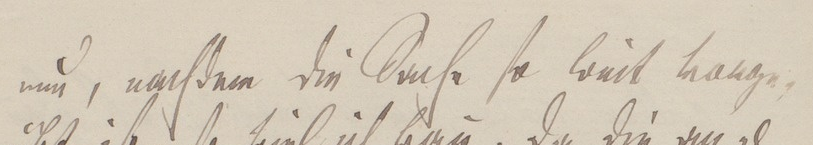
nun, nachdem die Sache so weit vorge-
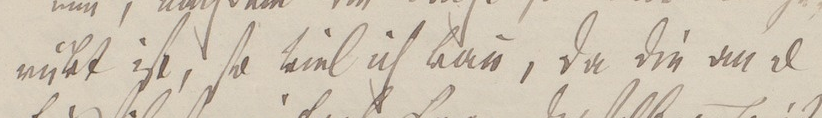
rückt ist, so viel ich kann, da die an &
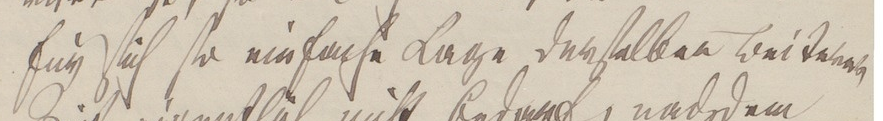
für sich so einfache Lage derselben weiterer
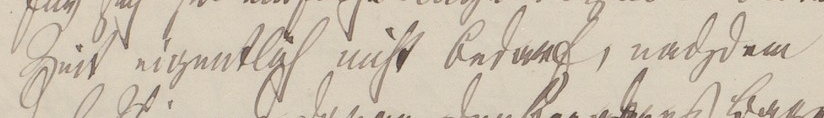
Zeit eigentlich nicht bedarf, nachdem
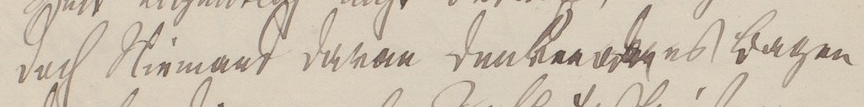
doch Niemand daran denken oder es wagen
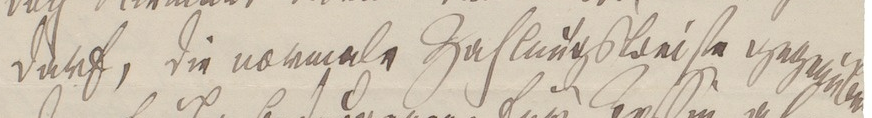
darf, die normale Zahlungsweise gegenüber
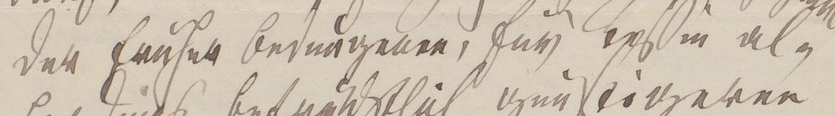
der früher bedungenen, für Tessin al-
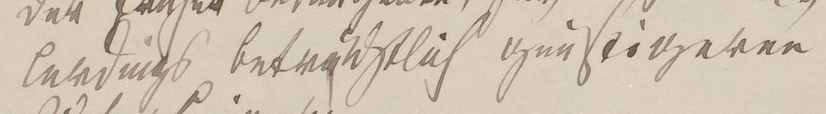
lerdings beträchtlich günstigeren
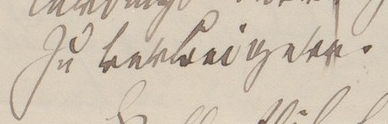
zu verweigern.
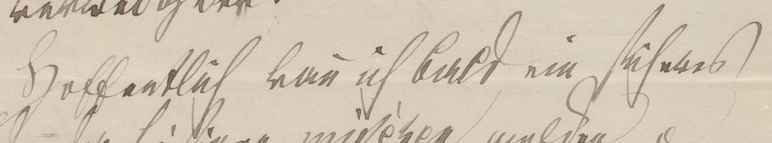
Hoffentlich kann ich bald ein sicheres
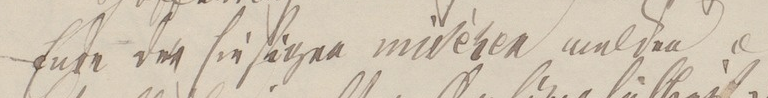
Ende der hiesigen misèren melden &
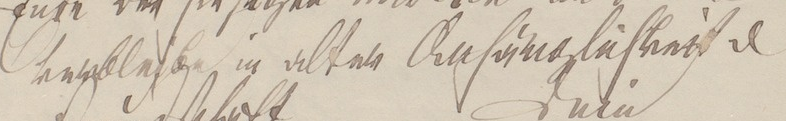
verbleibe in alter Anhänglichkeit &
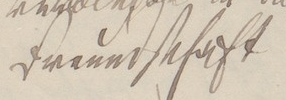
Freundschaft
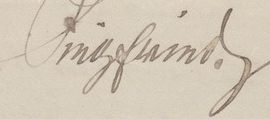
Siegfried.
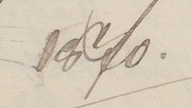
1870.
